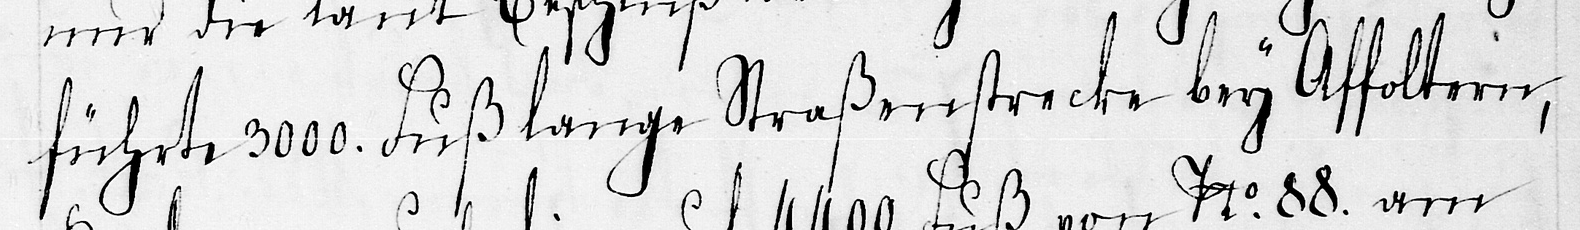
führte 3000. Fuß lange Straßenstrecke bey Affoltern,
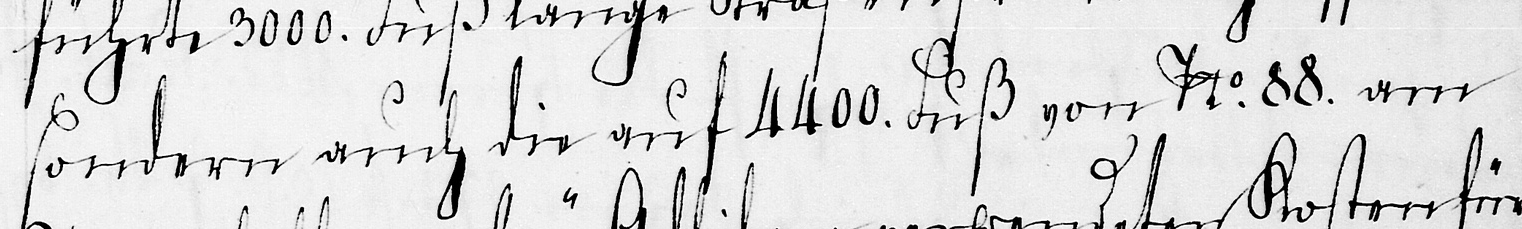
sondern auch die auf 4400. Fuß von No. 88. am
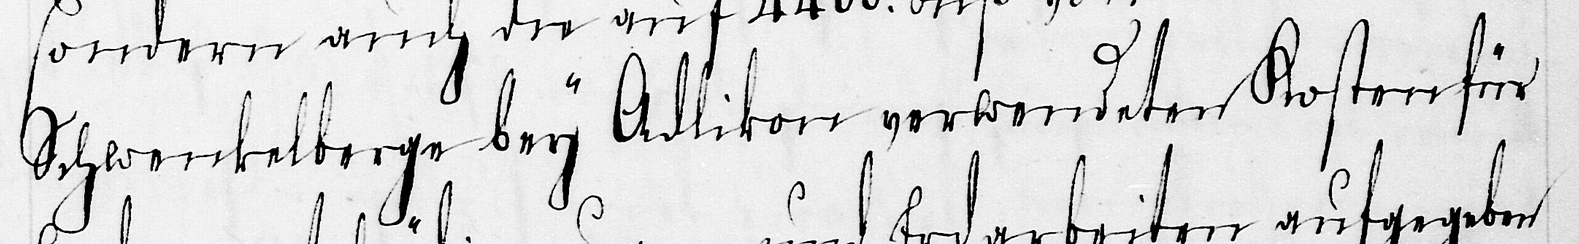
Schwenkelberge bey Adlikon verwendeten Kosten für
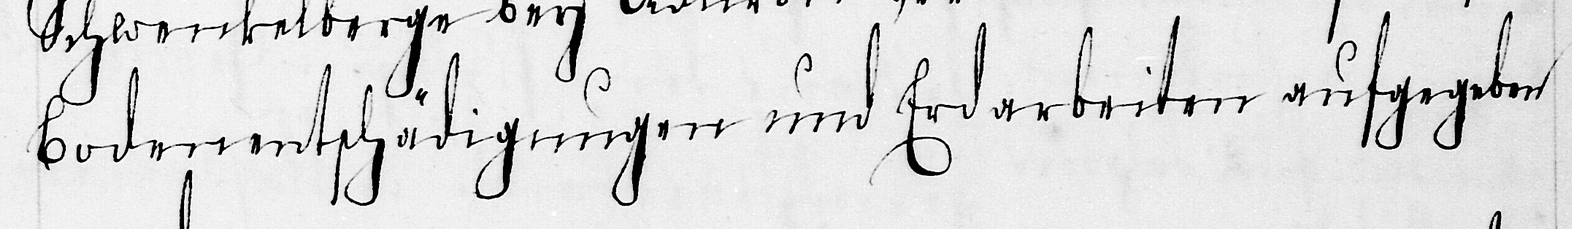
Bodenentschädigungen und Erdarbeiten aufgegeben
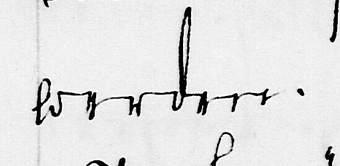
werden.
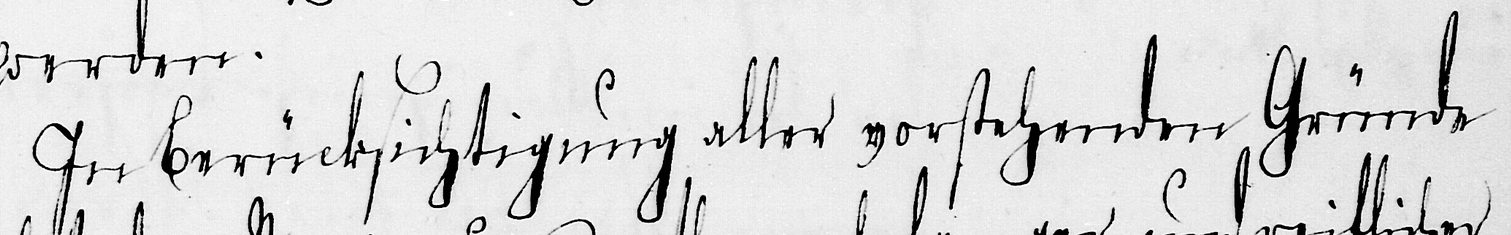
In Berücksichtigung aller vorstehenden Gründe
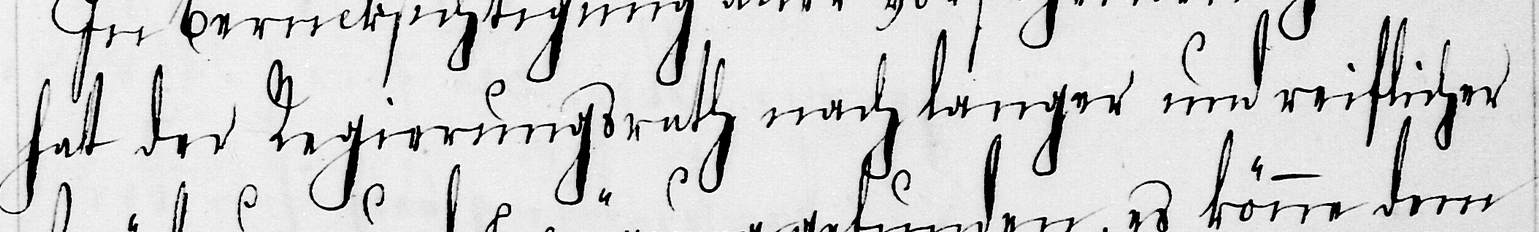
hat der Regierungsrath nach langer und reiflicher
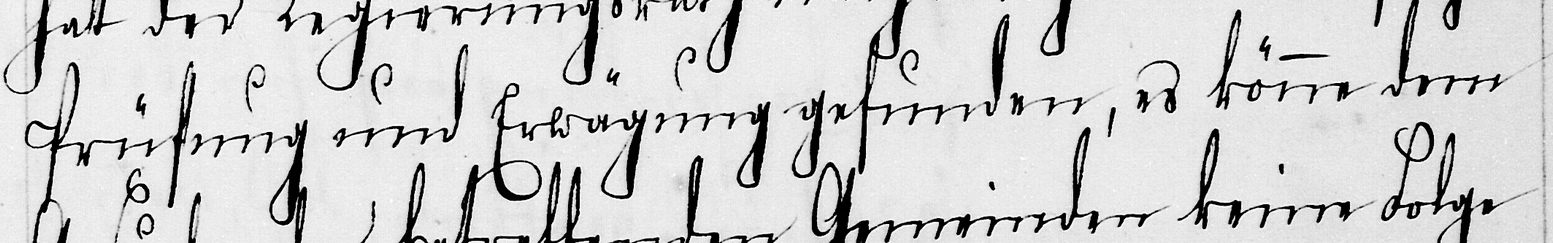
Prüfung und Erwägung gefunden, es könne dem
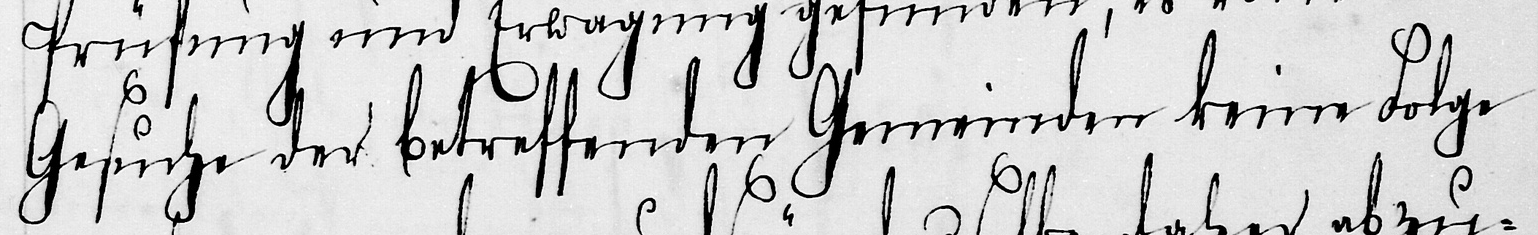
Gesuche der betreffenden Gemeinden keine Folge
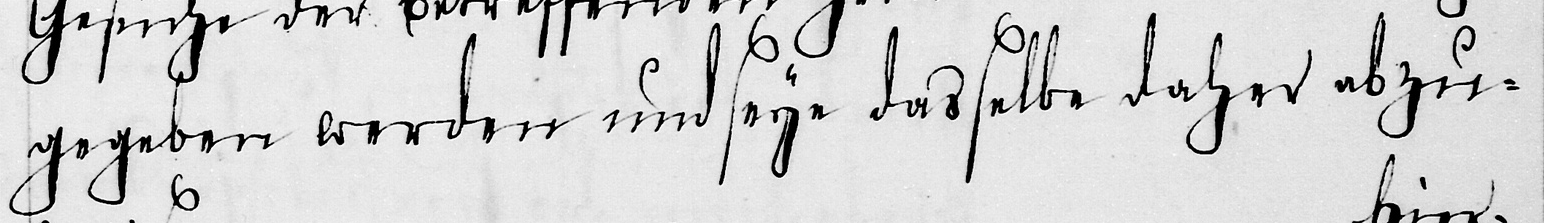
gegeben werden und seye dasselbe daher abzu¬
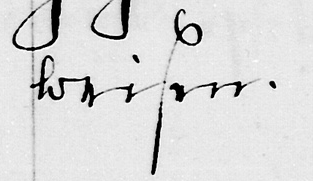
weisen.
